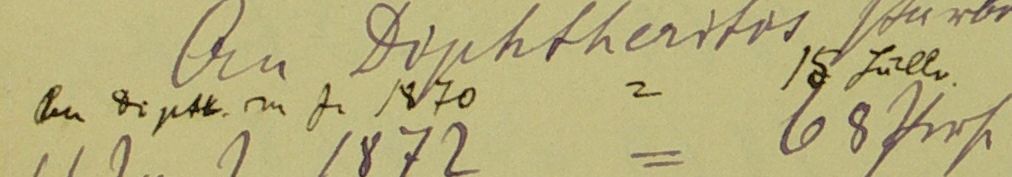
Im Jahre 1870 = 15 Fälle
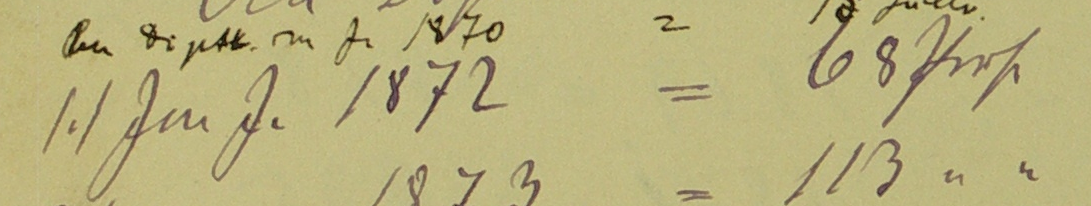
1.) 1872 = 68 Personen
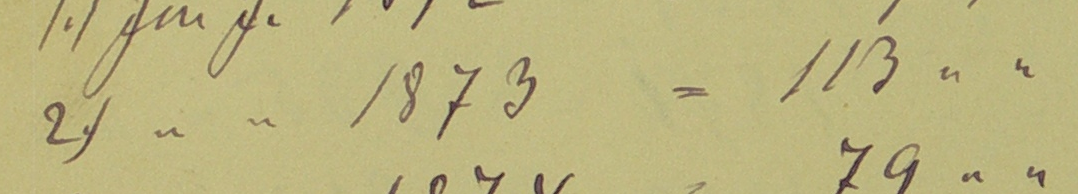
2.) 1873 = 113 *
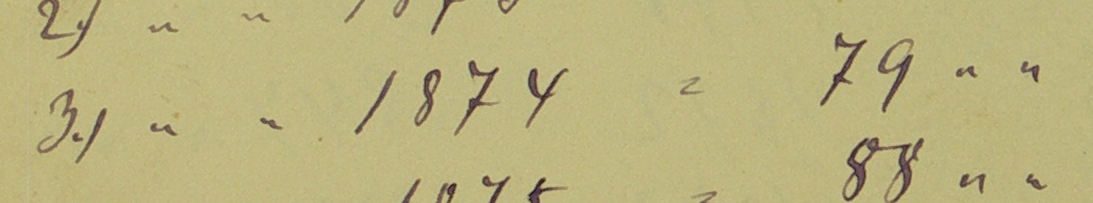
3.) 1874 = 79 *
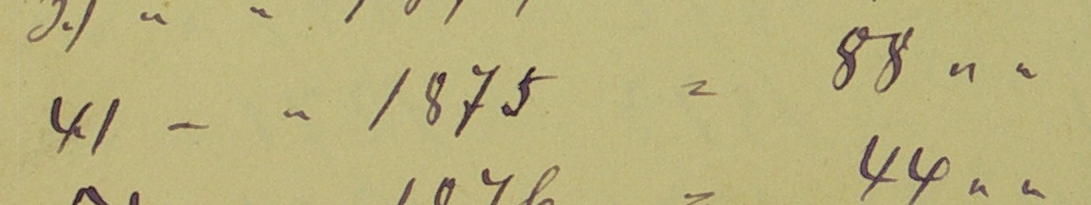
4.) 1875 = 88 *
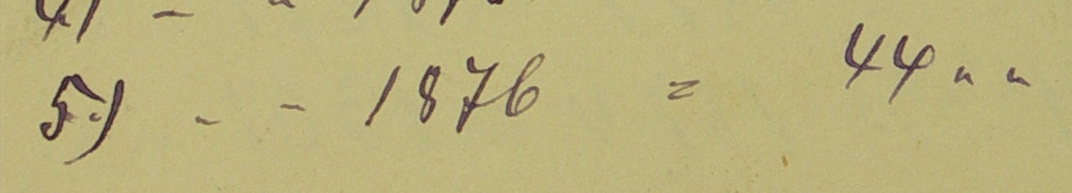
5.) 1876 = 44 *
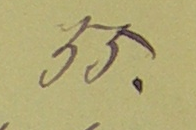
55
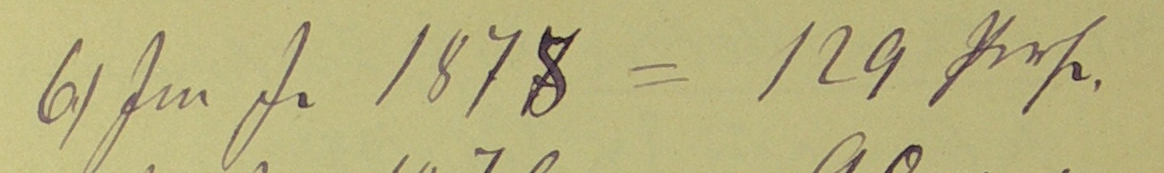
6.) 1878 = 129 *
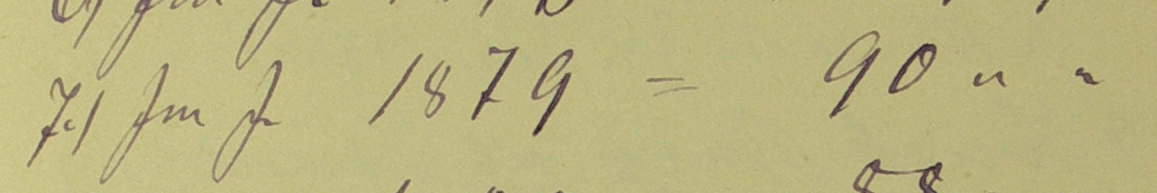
7.) 1879 = 90 *
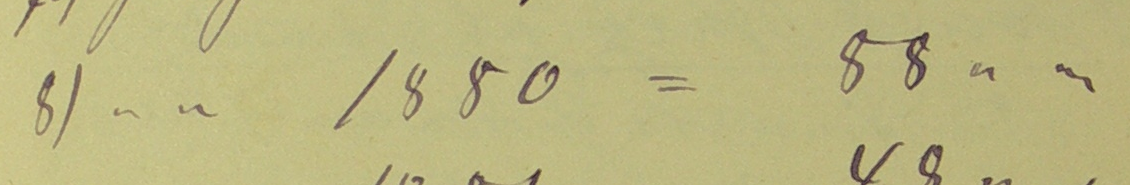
8.) 1880 = 88 *
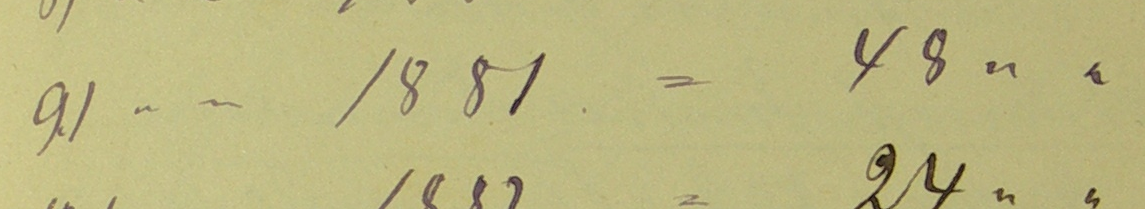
9.) 1881 = 48
